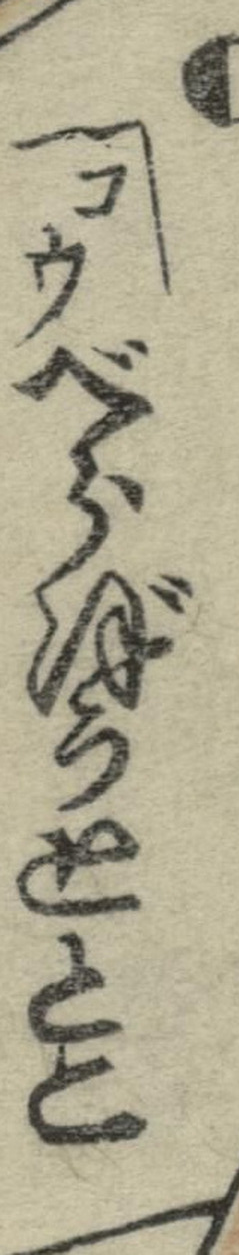〽コウべらぼうととこ
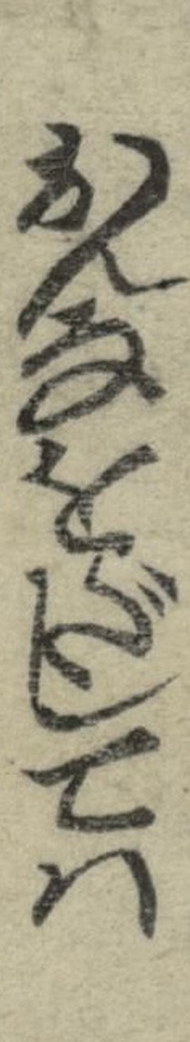おんなをだしては
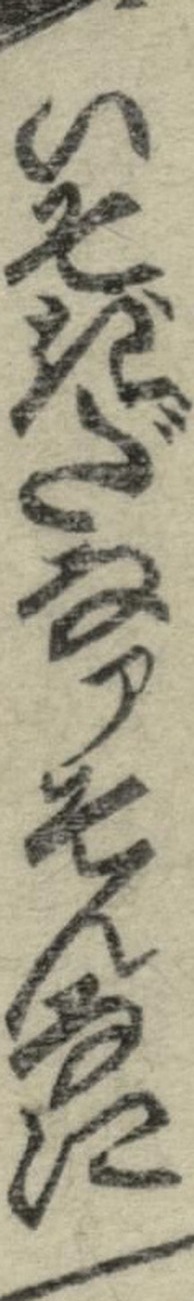いそぎだなアそんなに
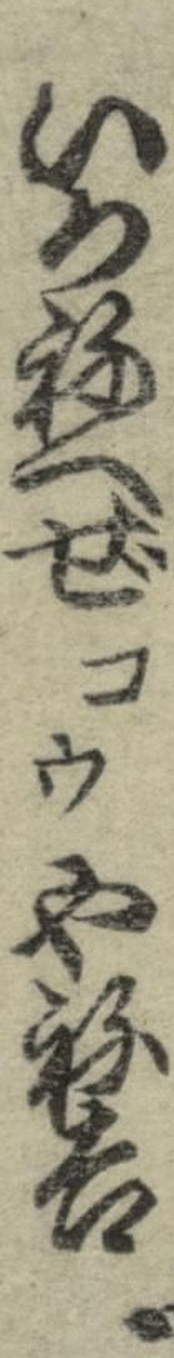いかねへぜコウやね吉
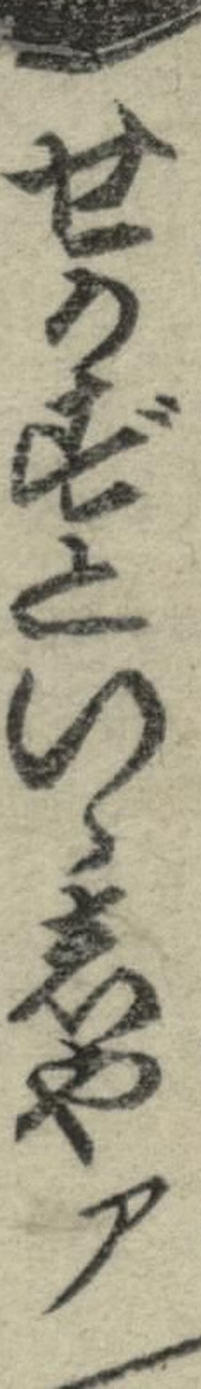せかずといゝしやア
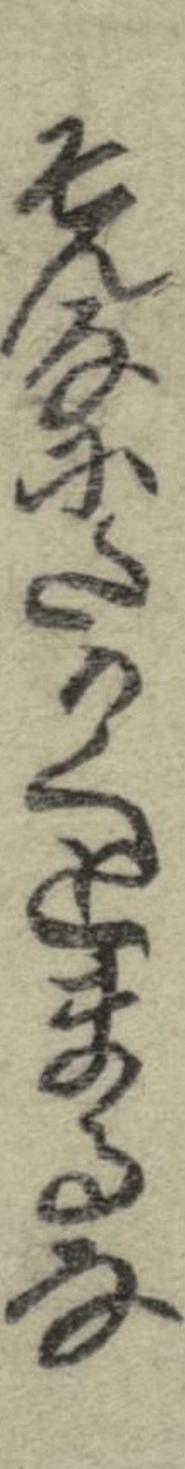そんなにたかくとまるな
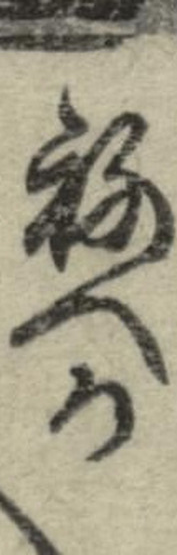ねへか
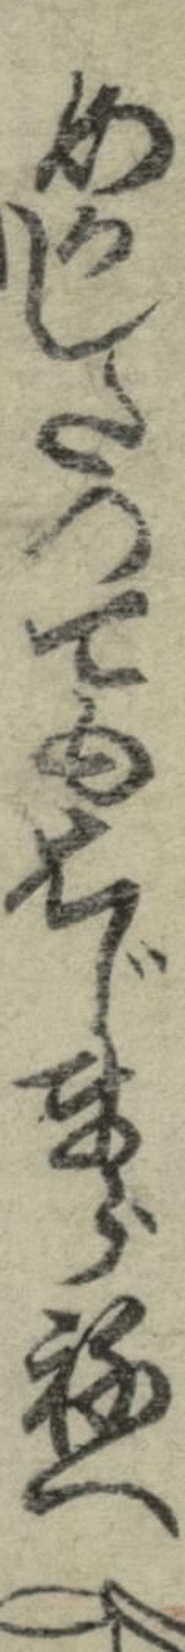めかしたつてもはじまらねへ
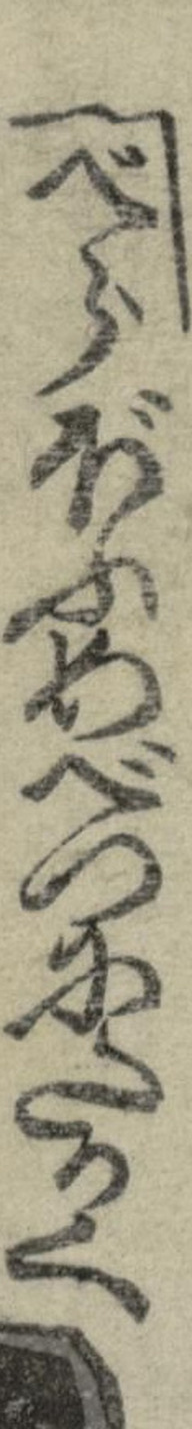〽べらぼふめべつにたかく
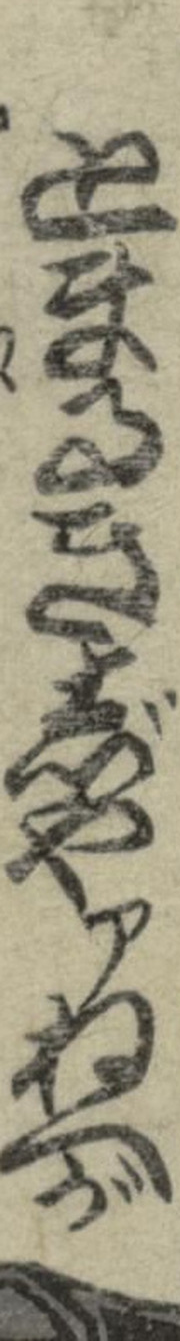とまるきじやアねへが
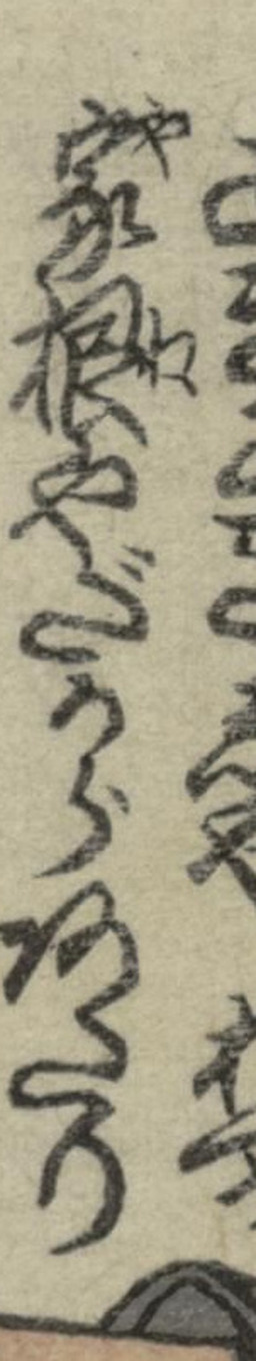家根やだからあたり
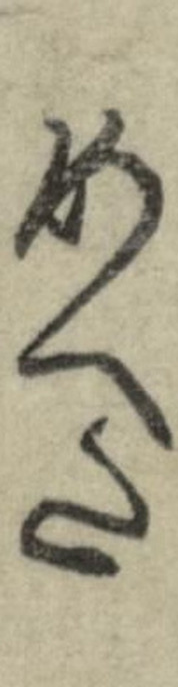めへた
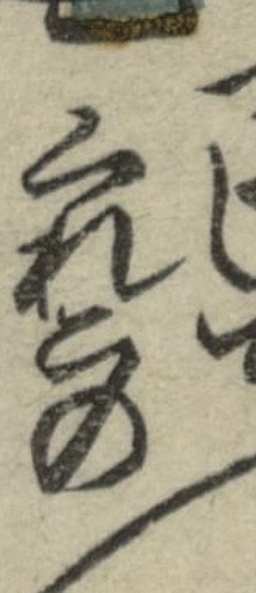くれこの
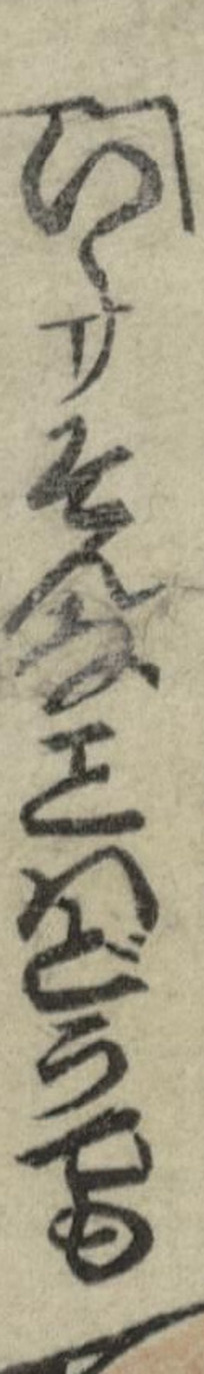〽いゝサそんなことはどうても
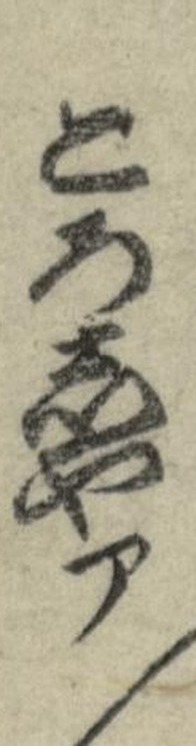ころしやア
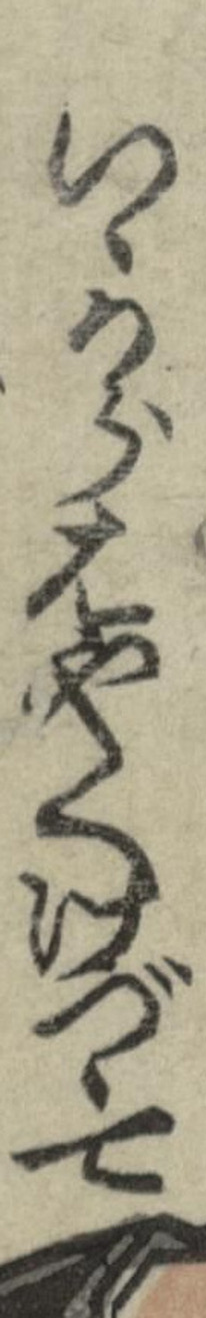いゝからはやくけづゝて
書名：瓢箪
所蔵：東京大学地震研究所図書室 Earthquake Research Institute Library, The University of Tokyo, JAPAN
